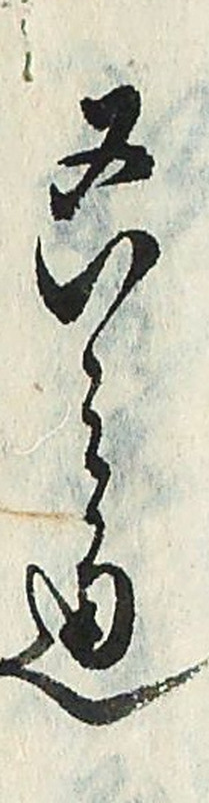右之通
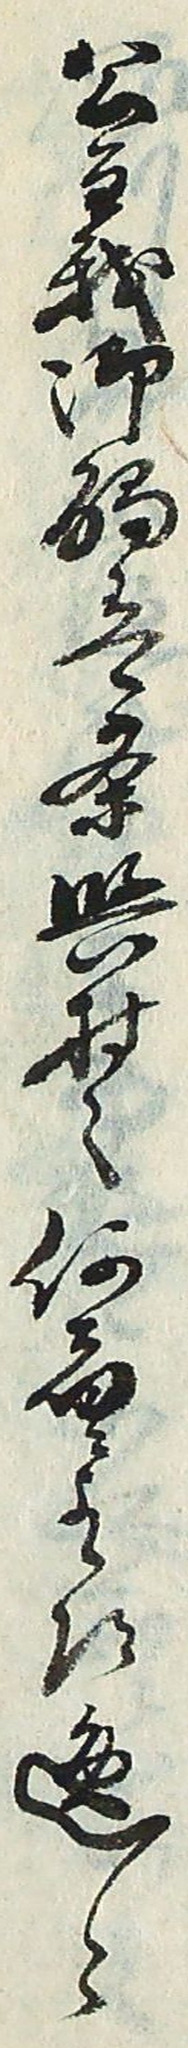公儀御触有之条与村々何者によらす逸々
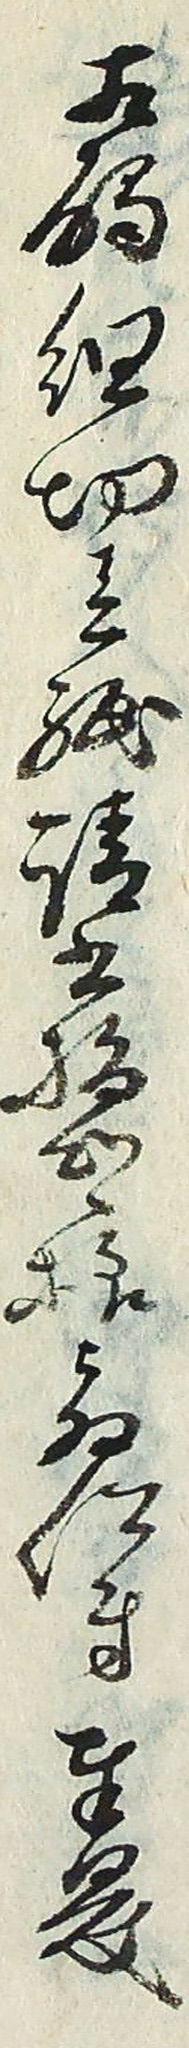相触組切壱紙請書可指出候様被仰付奉畏
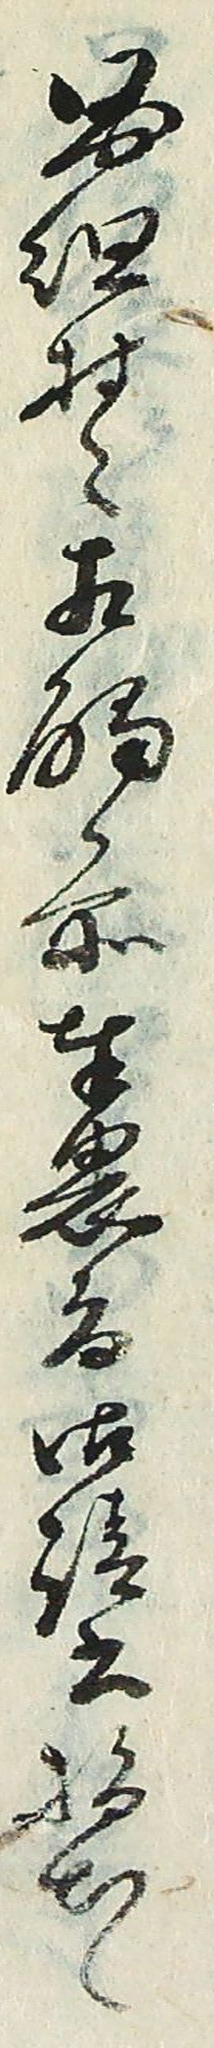則組村々相触候所奉畏旨御請書指出候
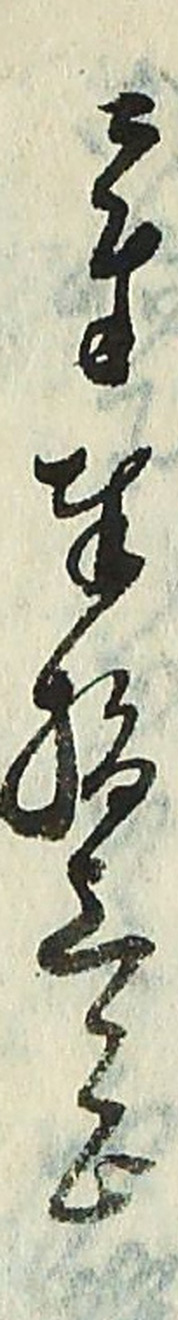に付た奉指上候以上
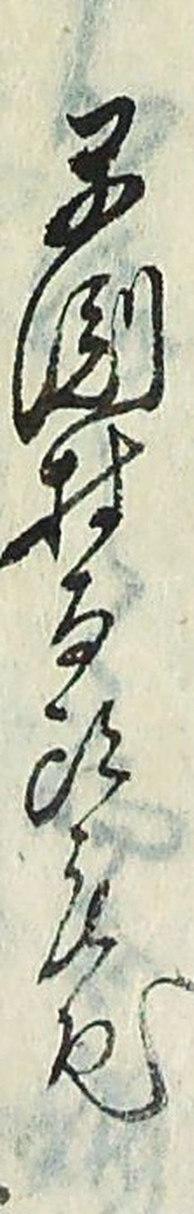早渕村与頭庄屋
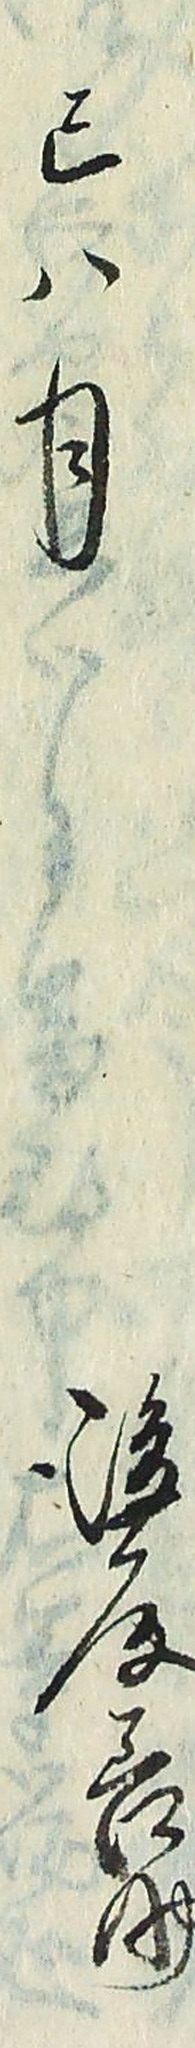巳八月後藤善助
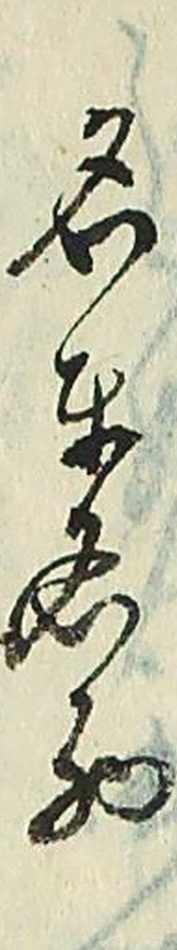名東名西
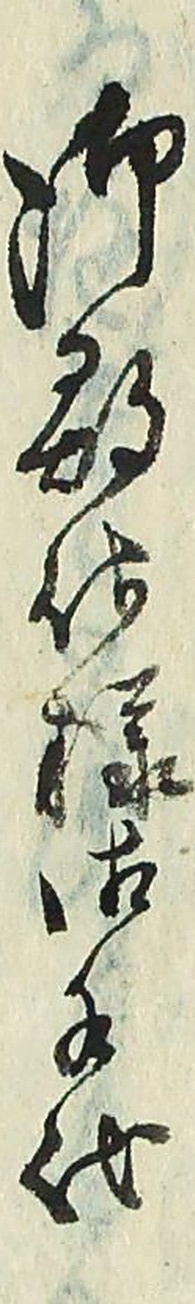御郡代様御手代
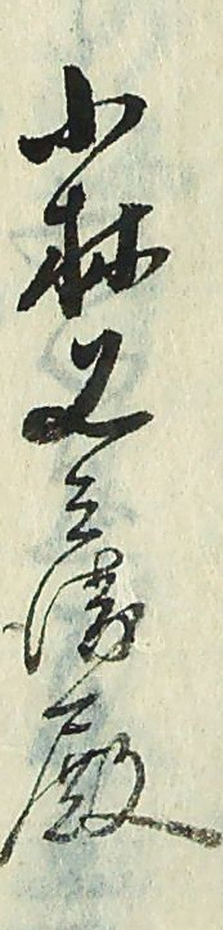小林又兵衛殿

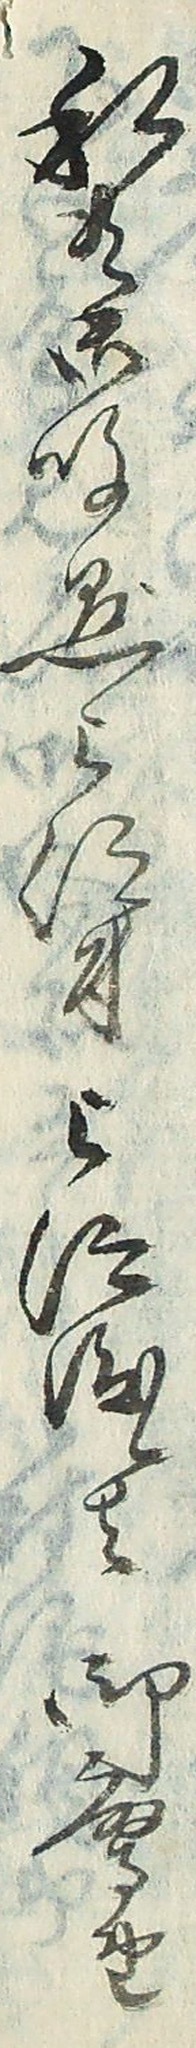私共御呼懸被仰付被仰渡候は御鷹野
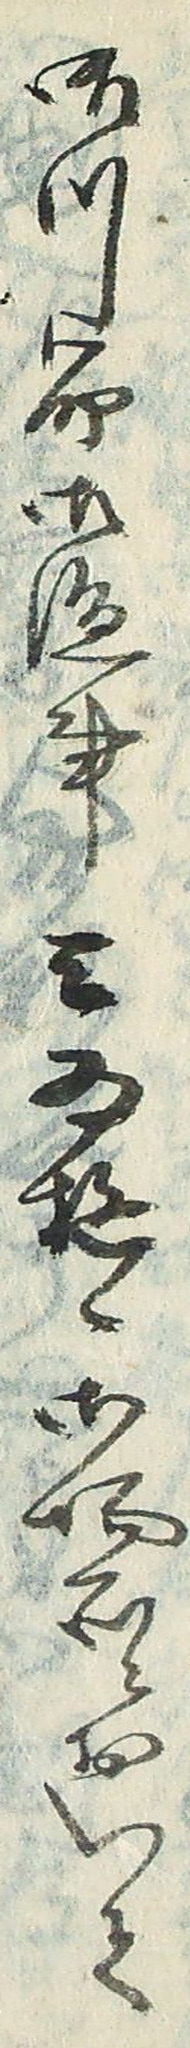御川筋御漁事被為遊候御場所において
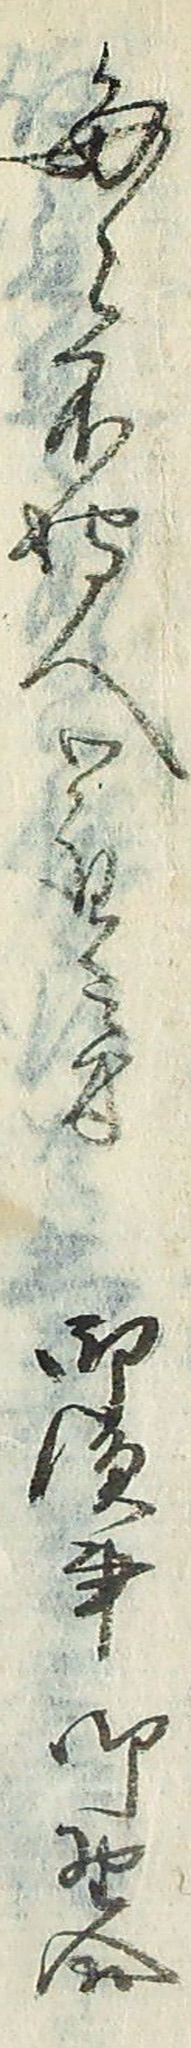毎々不埒人御座候に付御漁事御野合
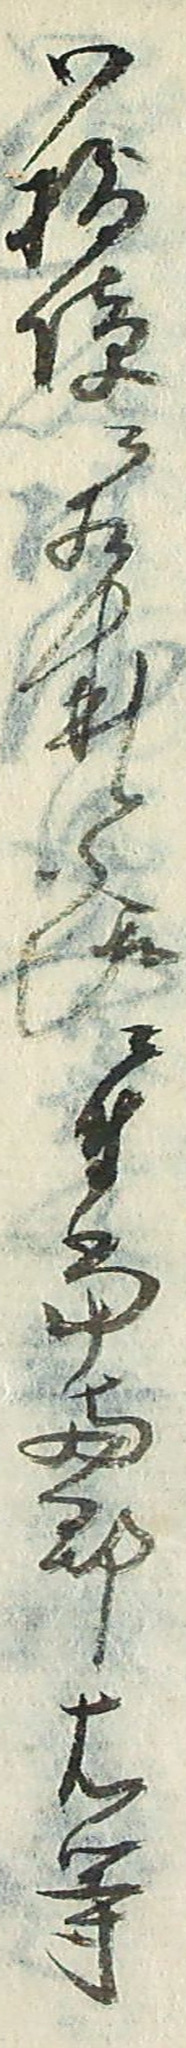御指障に相成候御趣に付当両郡右等
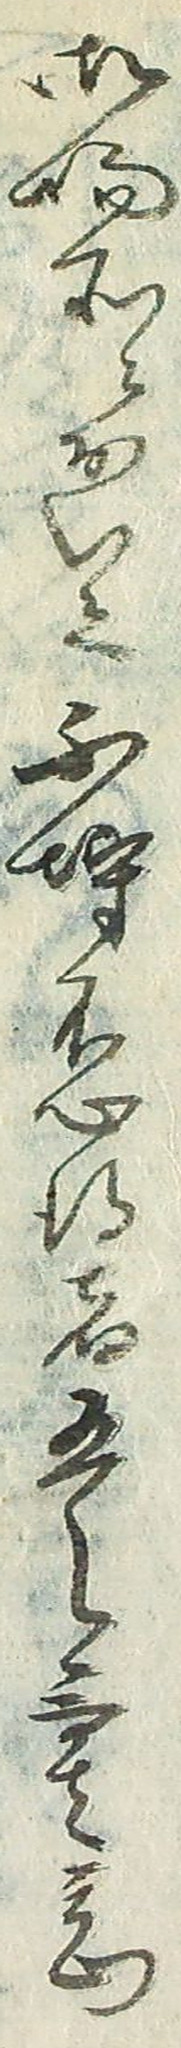御場所において不埒不心得者有之候而は甚
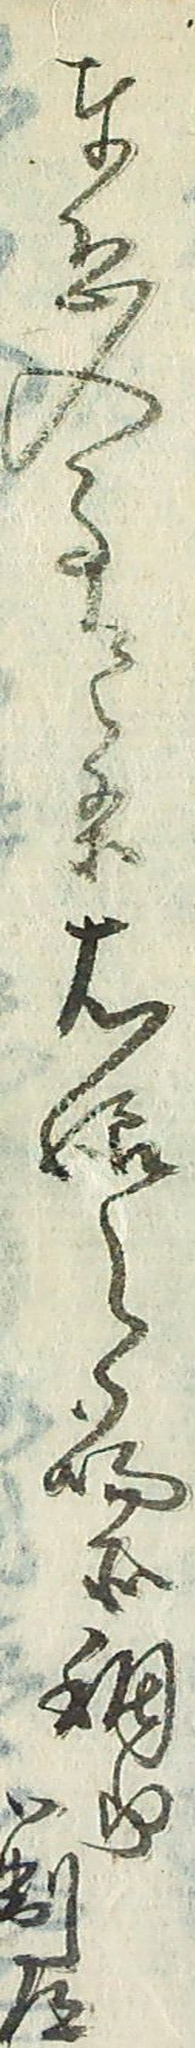奉恐入事に候条右様之御場所稠布御制道
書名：諸御用御□受書控
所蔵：鳴門教育大学 Naruto University of Education
